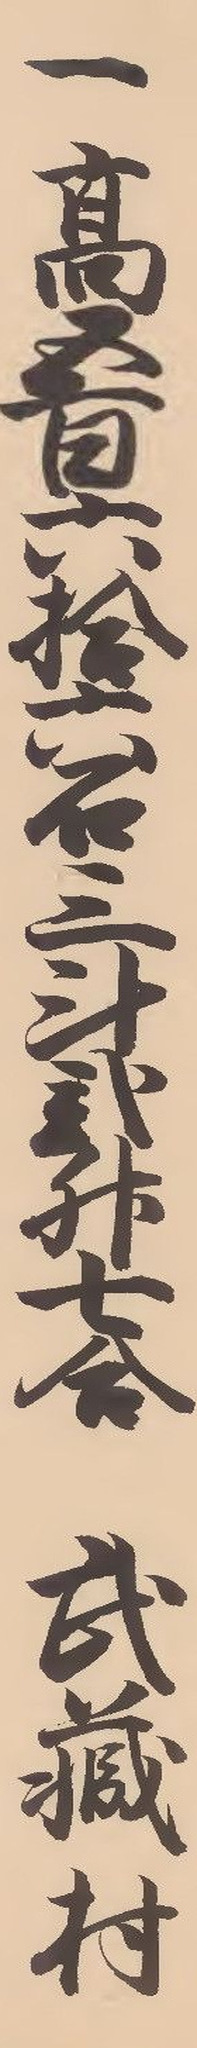一高五百六拾六石三斗弐升七合武蔵村
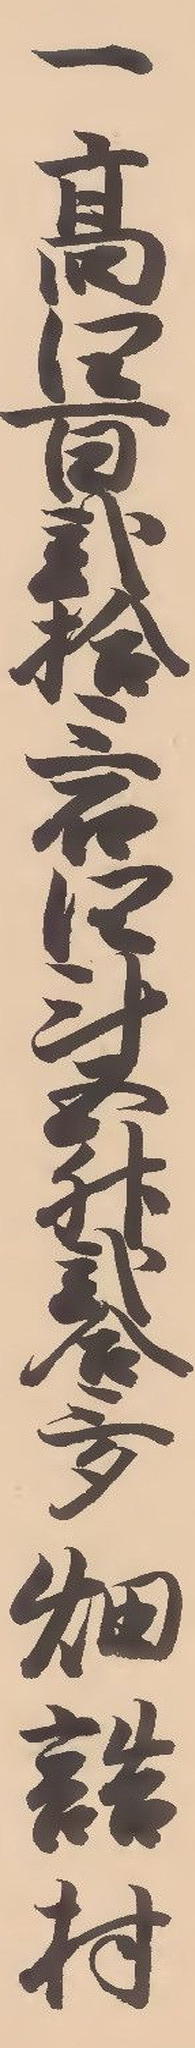一高四百弐拾三石四斗五升弐合三勺畑詰村
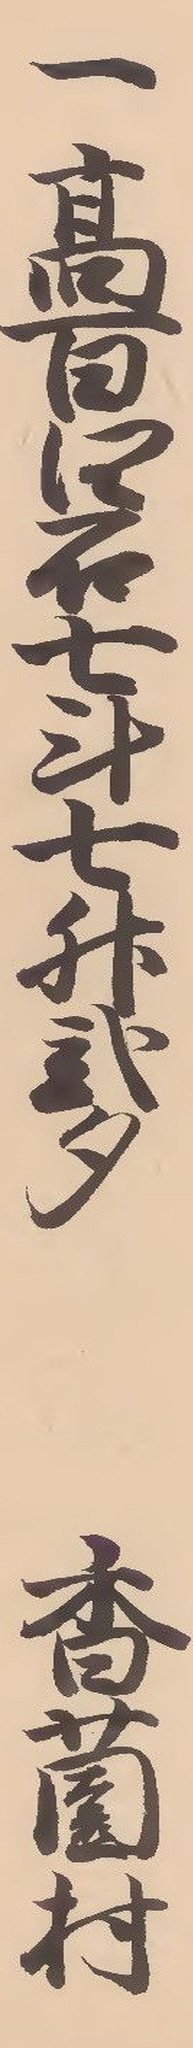一高百四石七斗七升弐勺香薗村

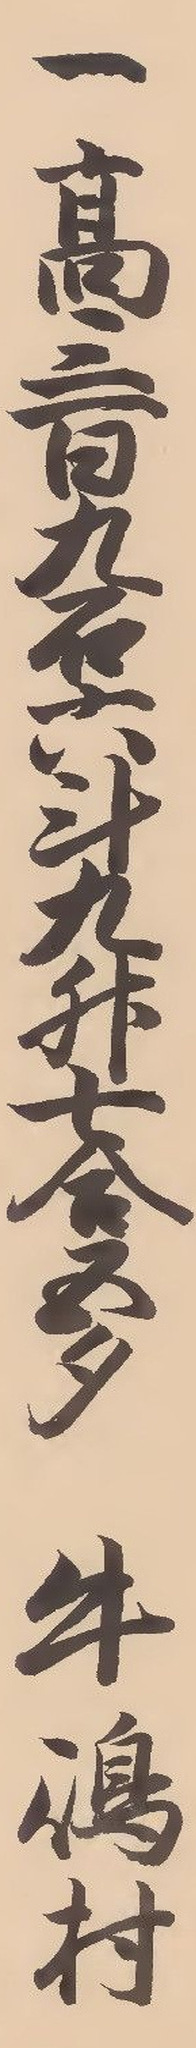一高三百九石六斗九升七合五勺牛島村
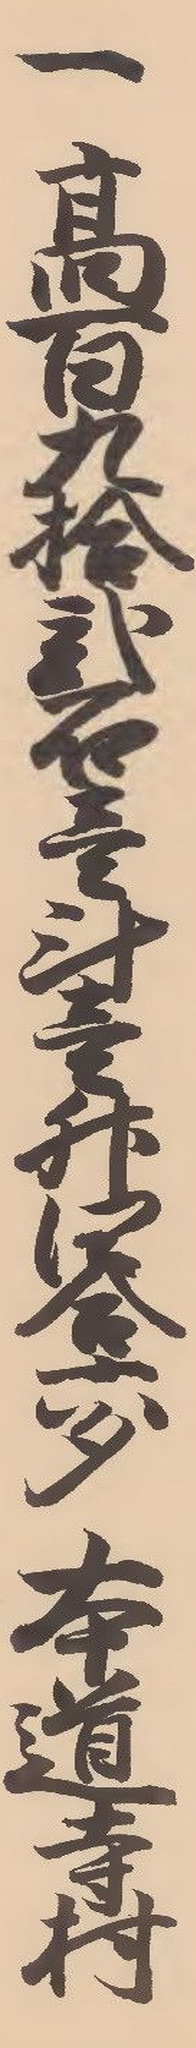一高百九拾弐石壱斗壱升四合六勺本道寺村
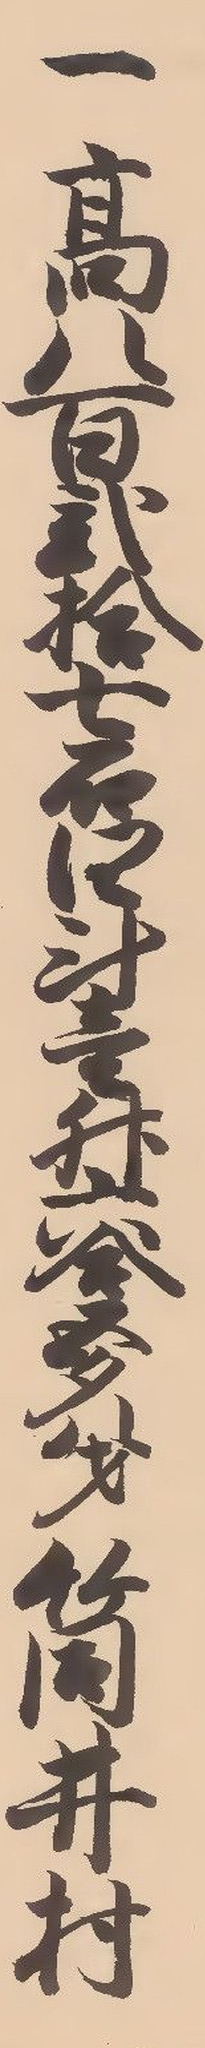一高八百弐拾七石四斗壱升六合五勺八才筒井村
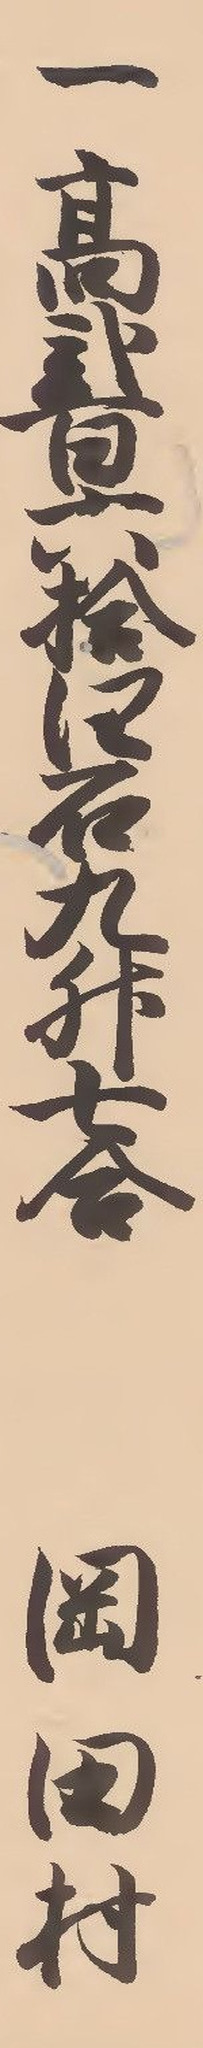一高弐百六拾四石九升七合岡田村
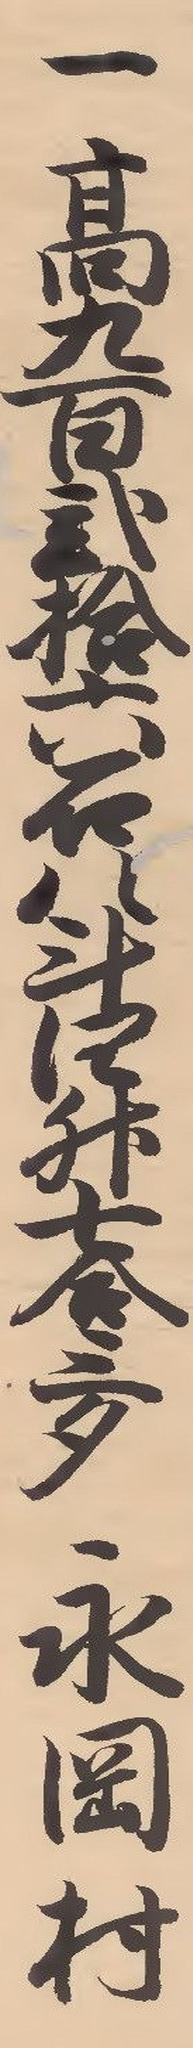一高九百弐拾六石八斗四升七合三勺永岡村
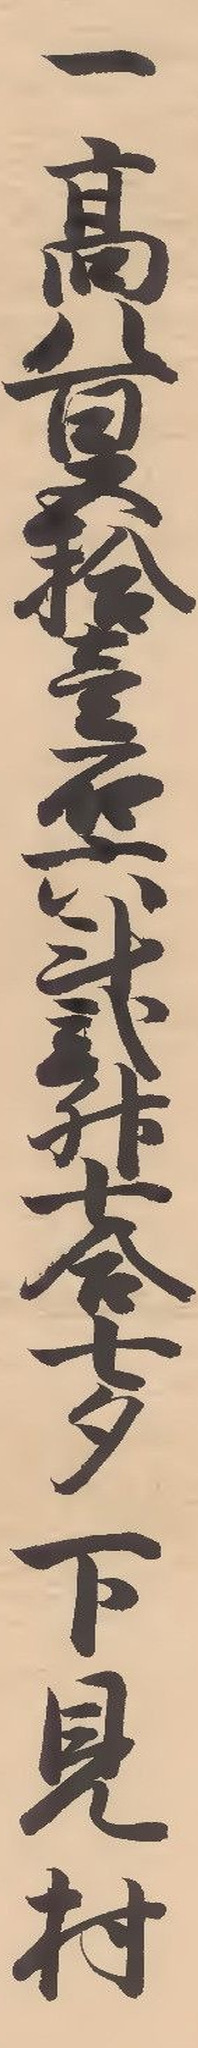一高八百五拾壱石六斗弐升七合七勺下見村
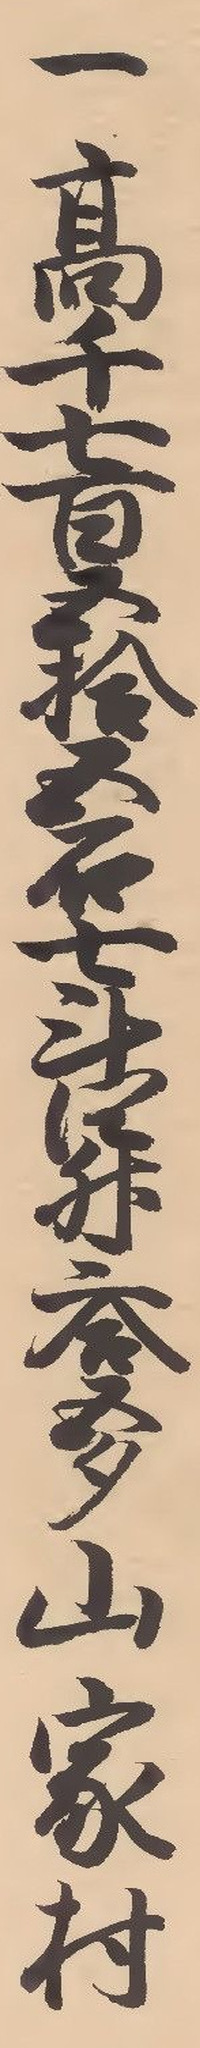一高千七百五拾五石七斗四升三合五勺山家村
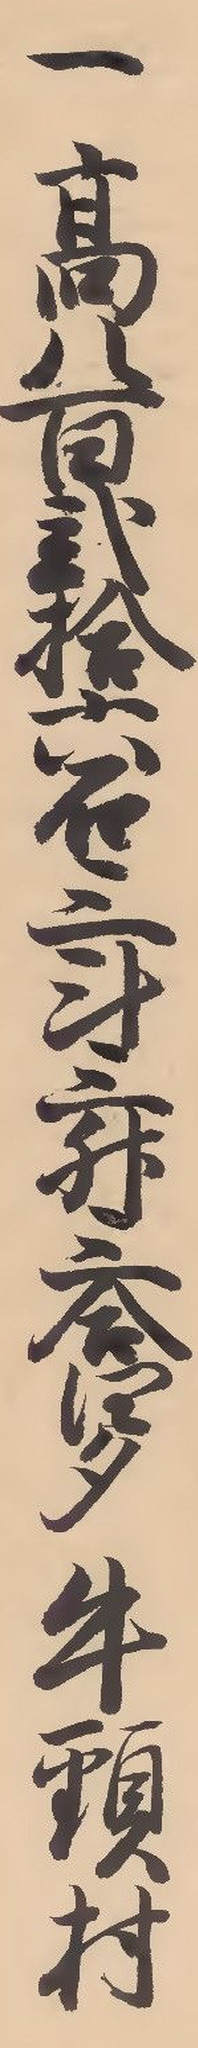一高八百弐拾六石三斗三升三合四勺牛頭村

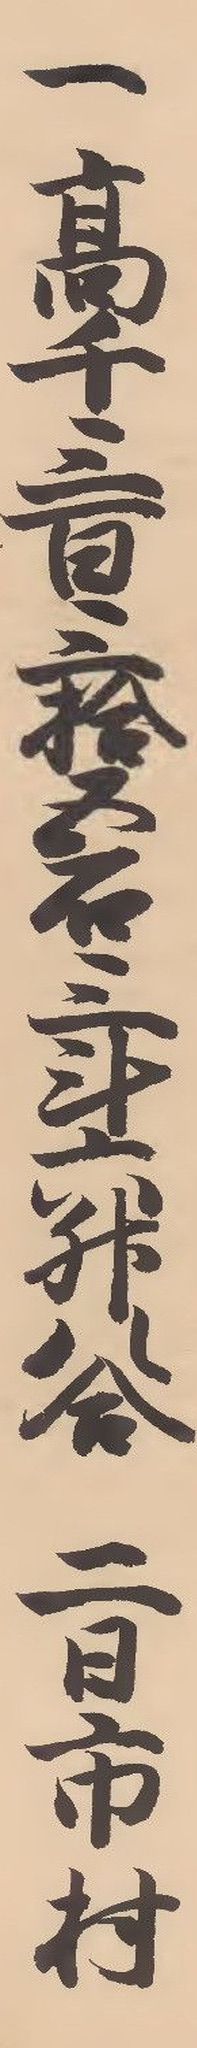一高千三百三拾五石三斗六升八合二日市村
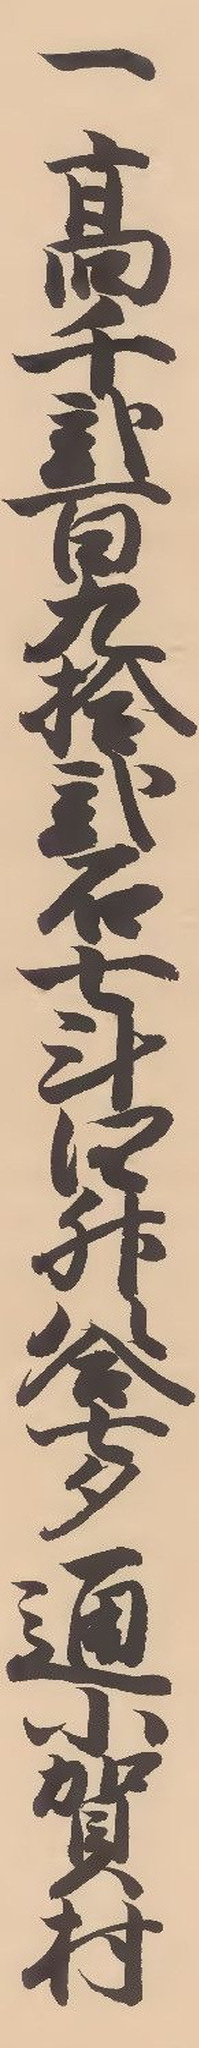一高千弐百九拾弐石七斗四升八合七勺通小賀村
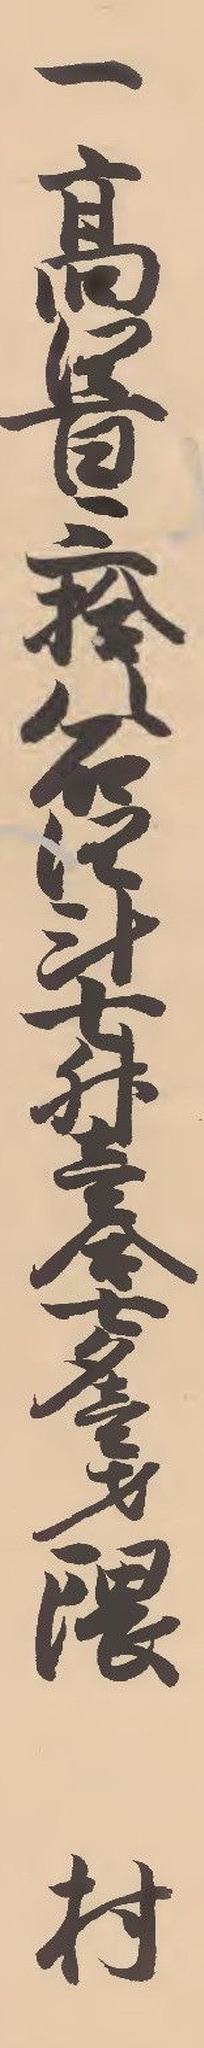一高四百三拾八石四斗七升壱合七勺壱才隈村
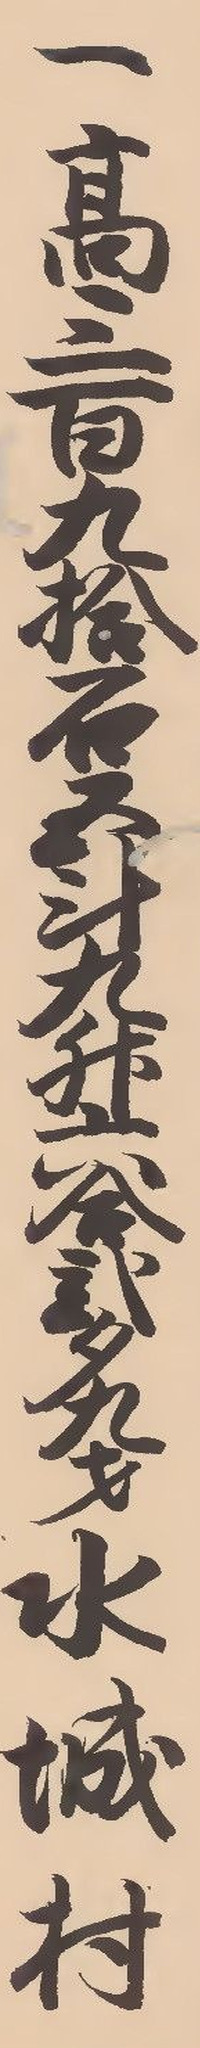一高三百九拾石五斗九升六合弐勺九才水城村
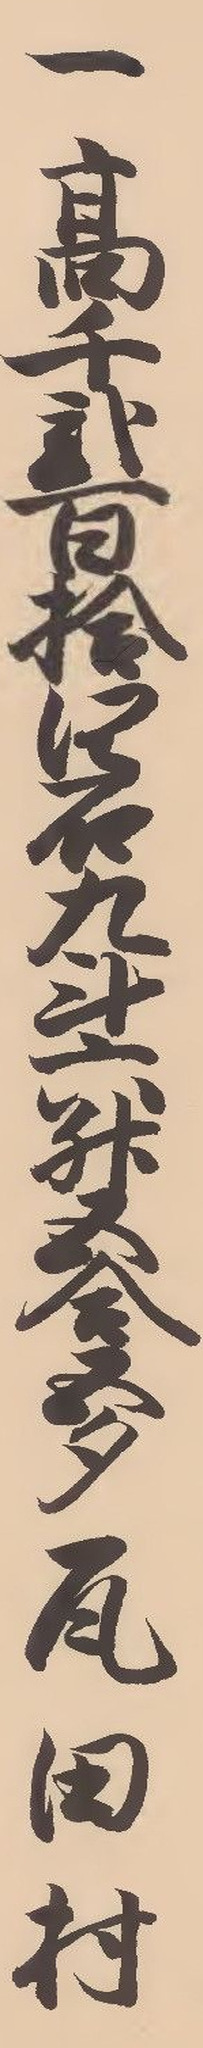一高千弐百拾四石九斗六升五合五勺瓦田村
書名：筑前国郷帳
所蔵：国立公文書館 National Archives of Japan
